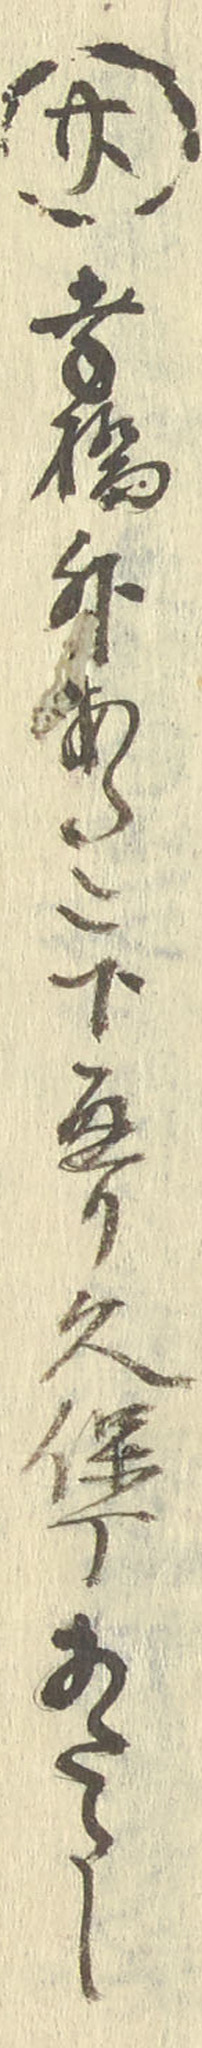廿幸橋外あたこ下通り久保丁あこたし
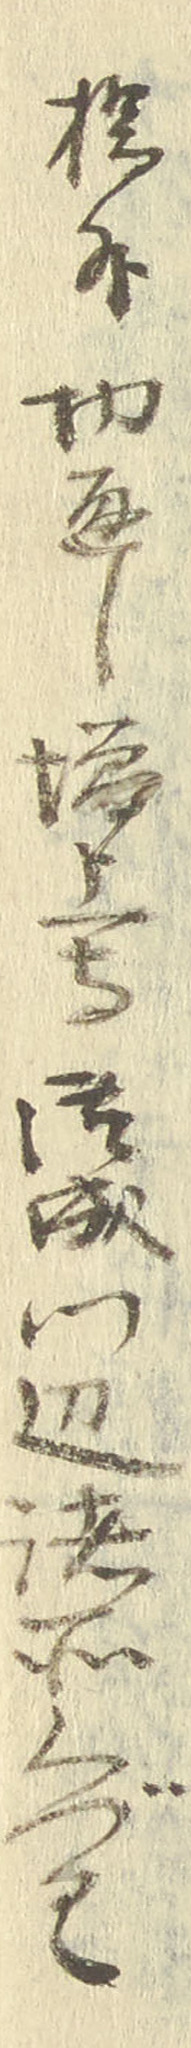橋外切通し増上寺御成門辺諸所くづるゝ

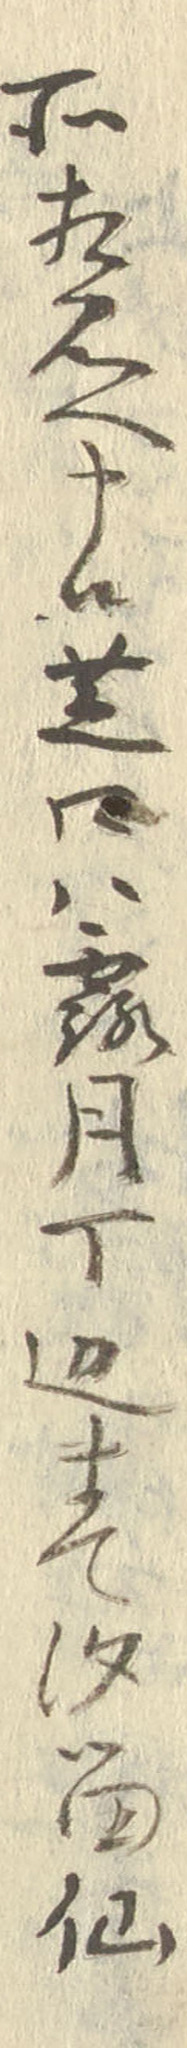所相見へ申候芝口ハ露月丁辺まて汐留仙
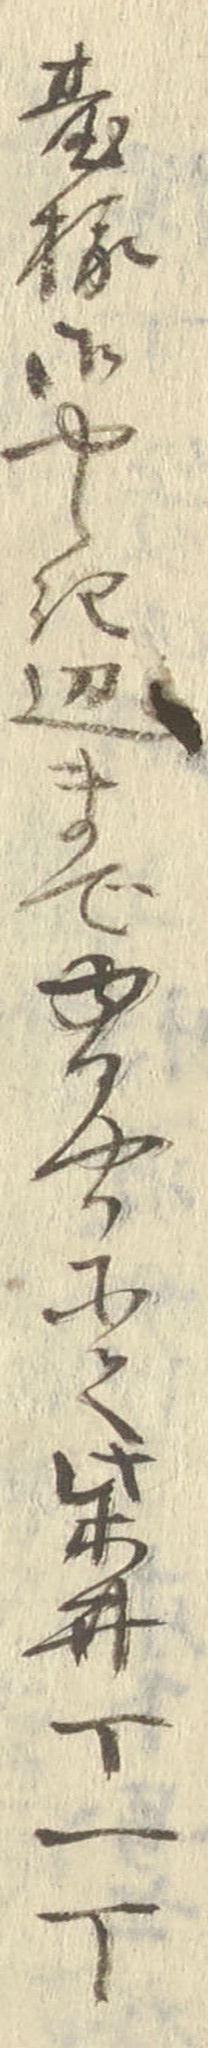臺様御やき辺までゆるやかにて柴井丁一丁
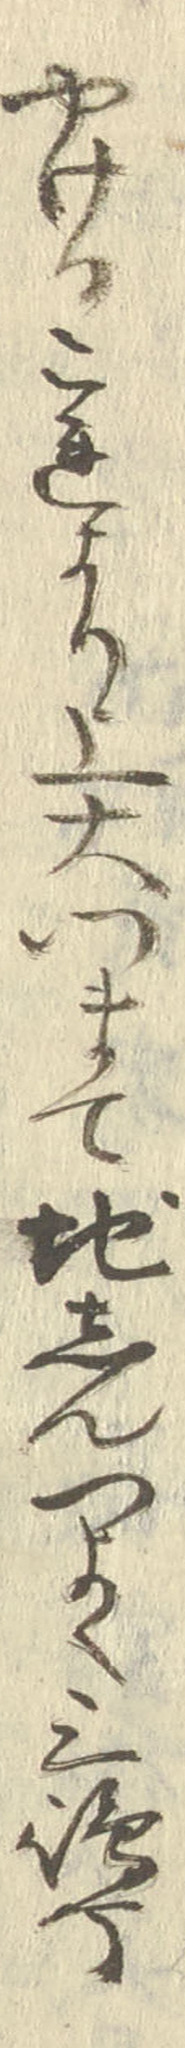やけるこれより上大門まて地しんつよく三嶋丁
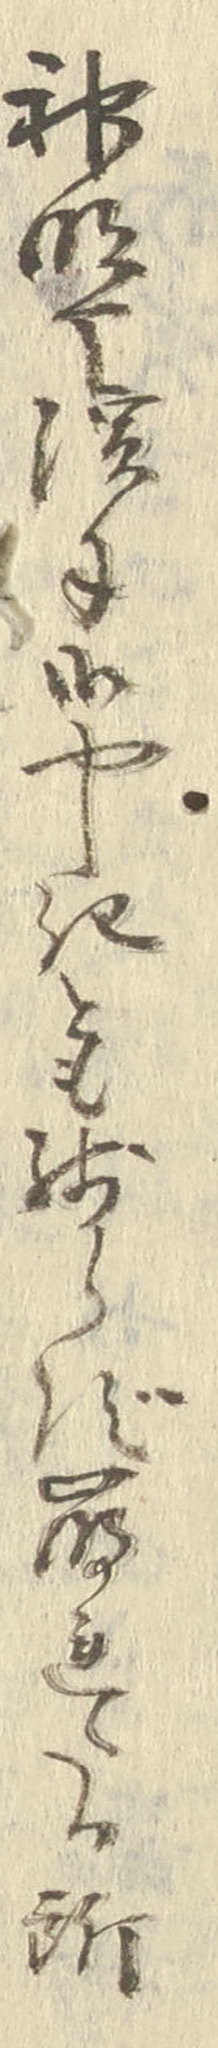神明丁濱に御やきとも残らず崩れたる所
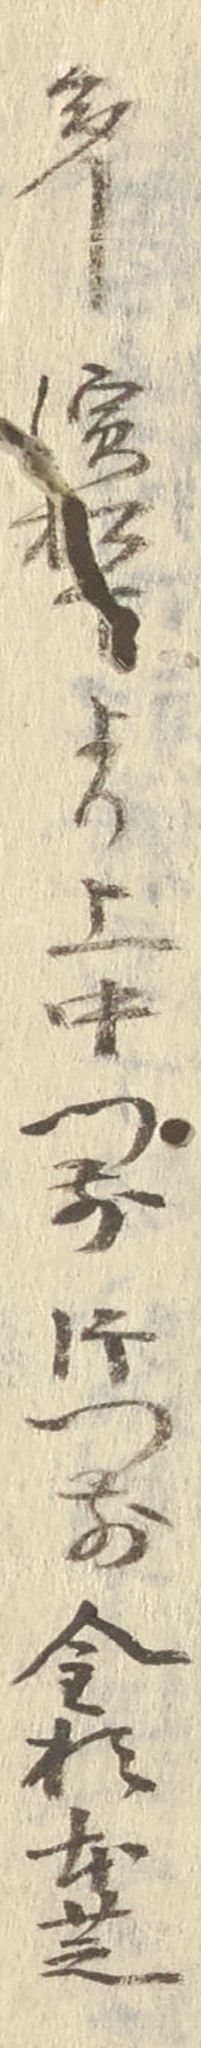多し濱松丁より上中門前片門前金杉本芝
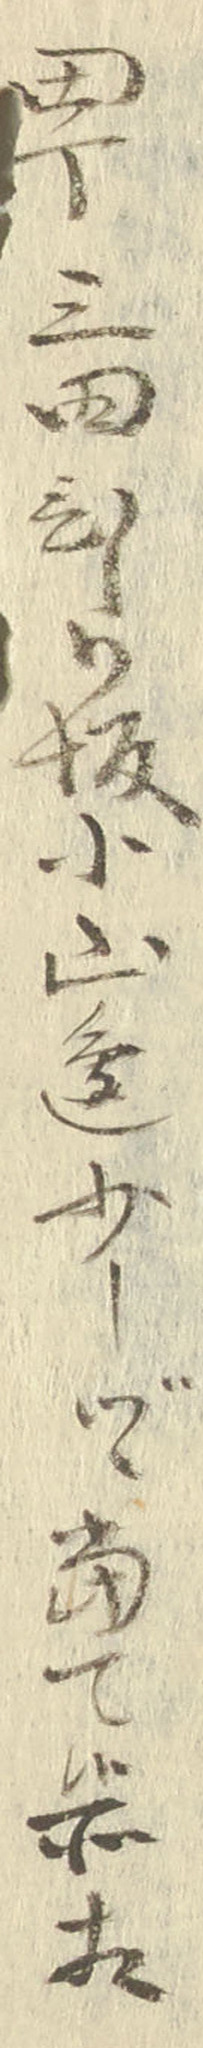田丁三田ひしり坂小山邊少しヅヽ當て候所相
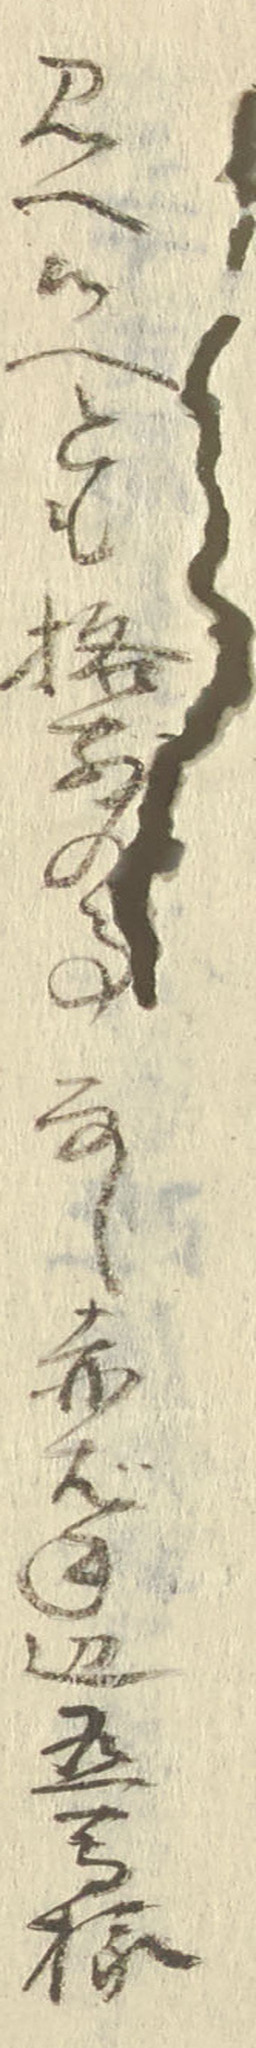見へ候へとも格別の事なし赤ばね辺有馬様
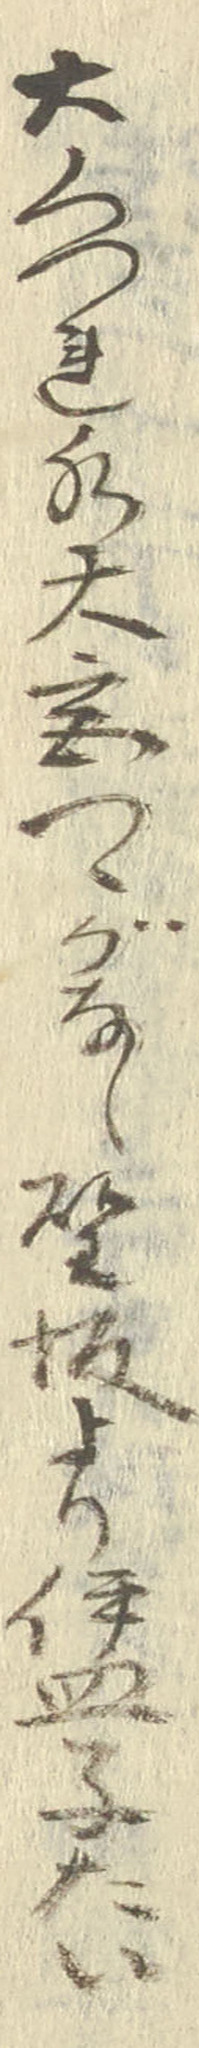大くつれ水天宮つゝがなし聖坂より伊皿子たい
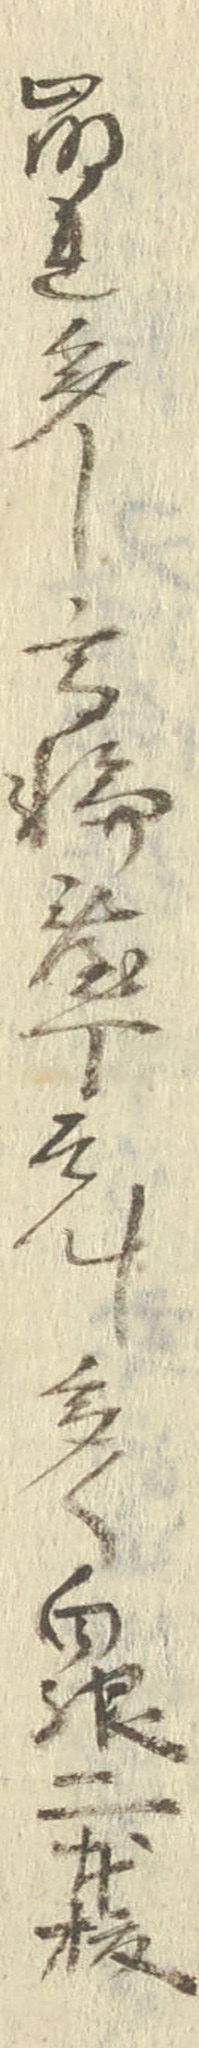崩れ多し高輪臺丁そんし多く白銀二本抜
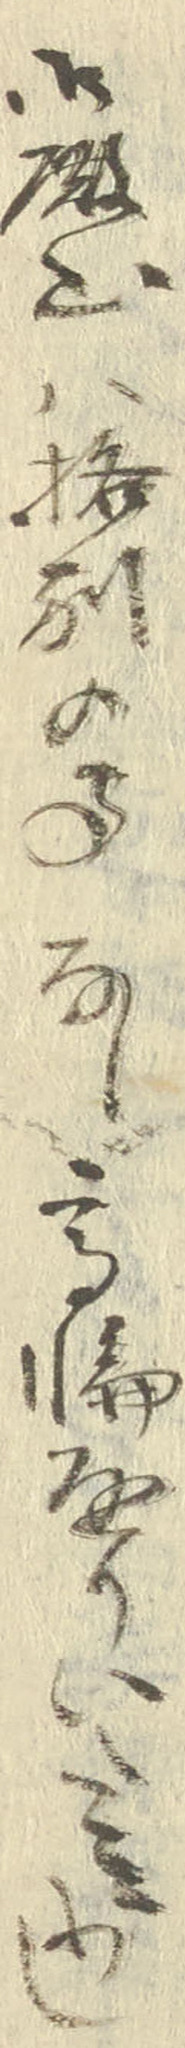御殿山ハ格別の事なし高輪通りいたミ少し
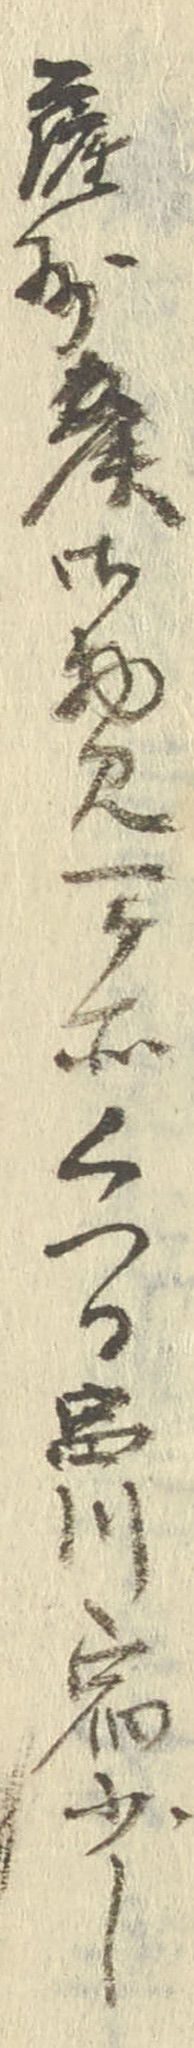薩州侯御物見一ヶ所くつる品川宿少し
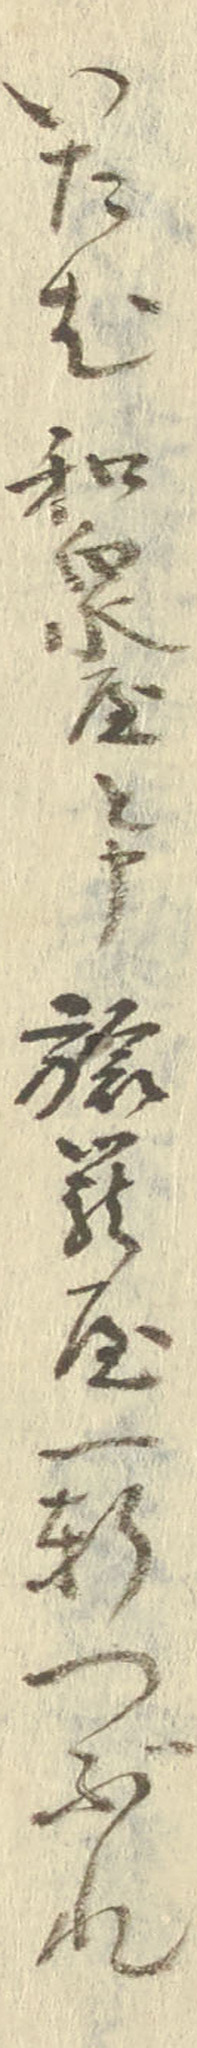いたむ和泉屋と申旅籠屋一軒つぶれ
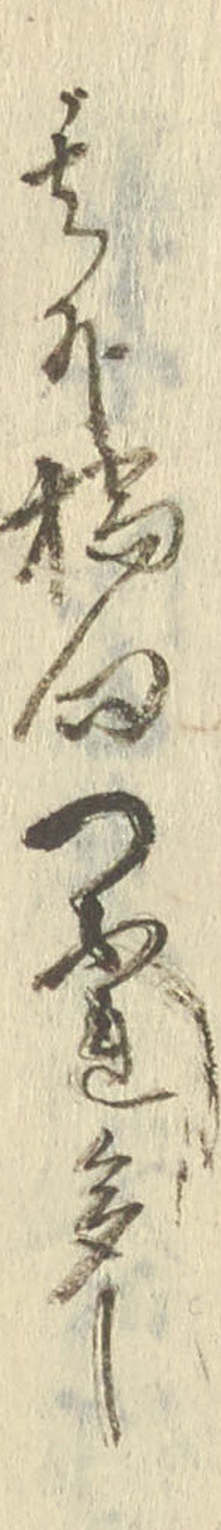其外橋向つふれ多し
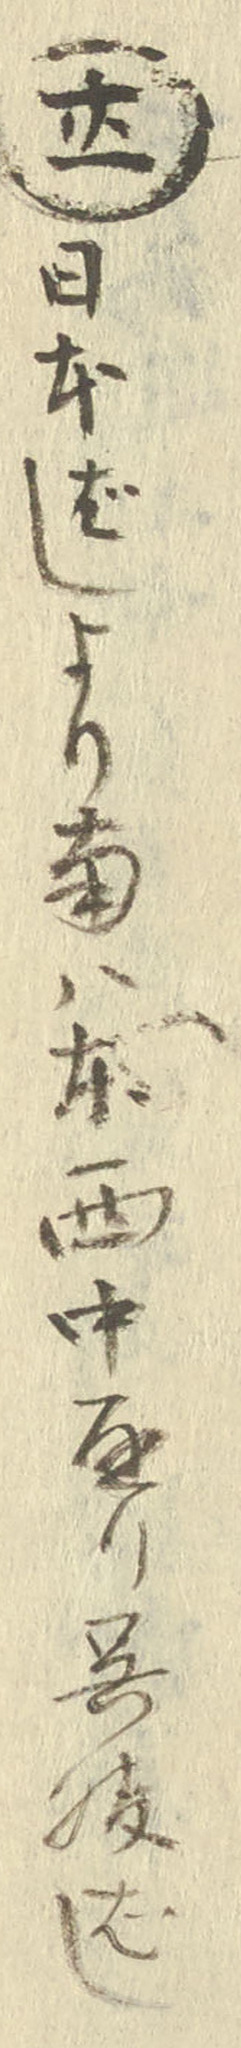廿一日本ばしより南ハ東西中通り呉服ばし
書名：御府内御屋敷方市中共地震類焼場所明細書之冩兼街道筋近郷聞書
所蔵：東京大学総合図書館 General Library in the University of Tokyo, JAPAN
